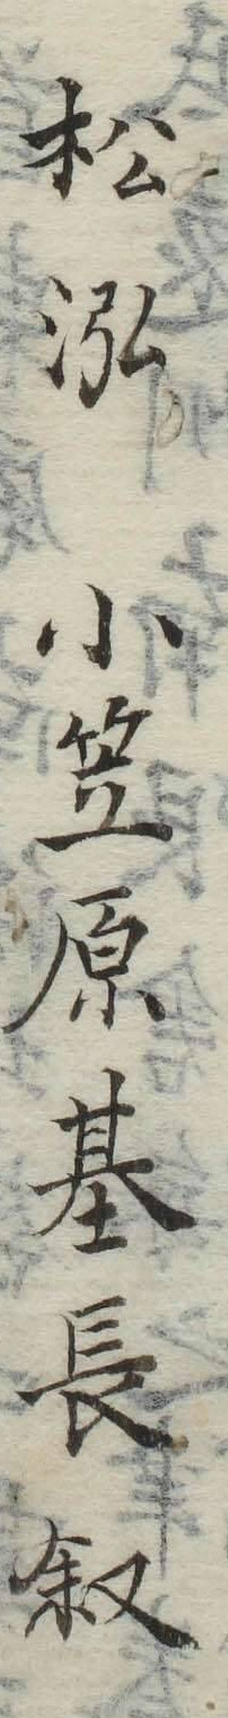松泓小笠原基長叙
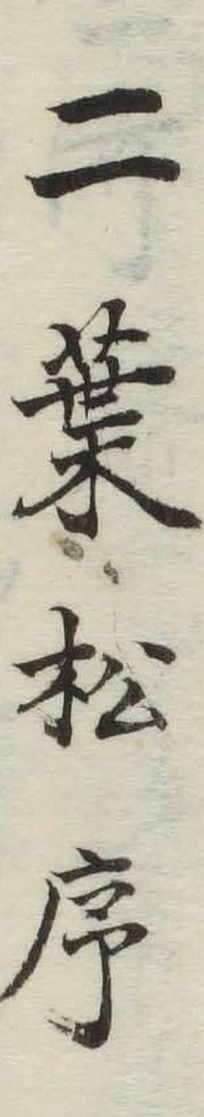二葉松序
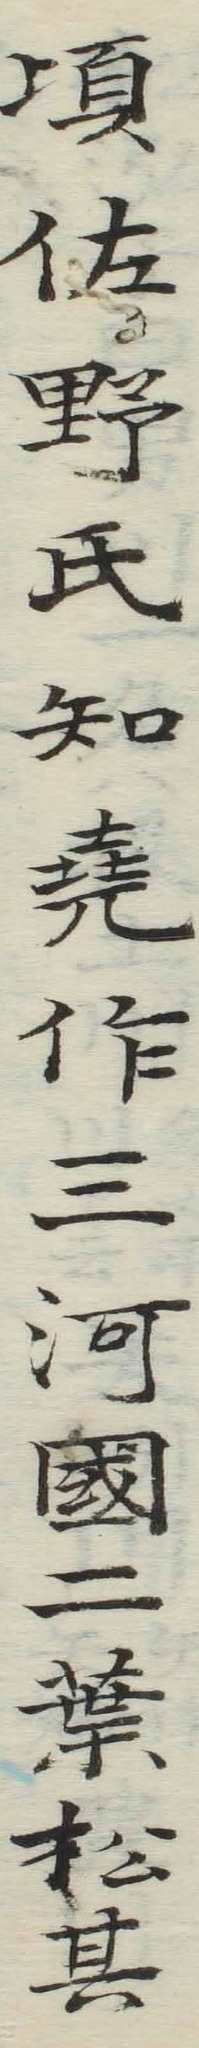項佐野氏知堯作三河國二葉松其
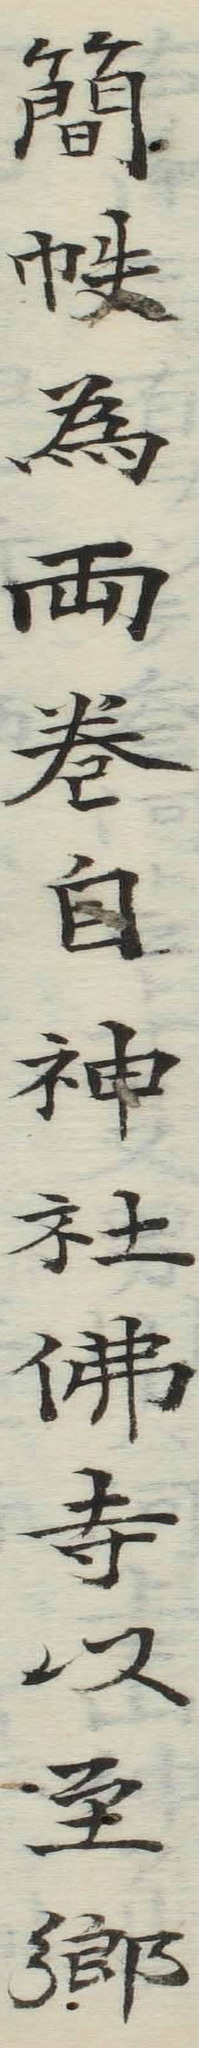簡帙為兩巻自神社佛寺以至郷
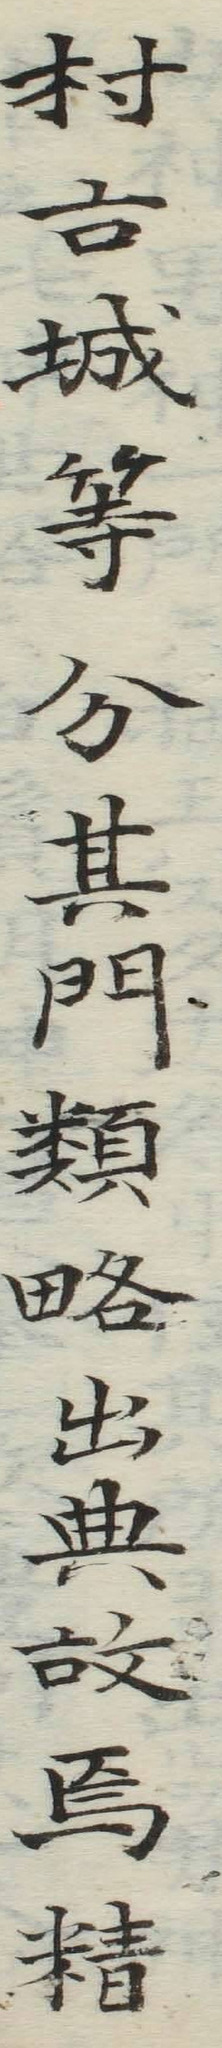村古城等分其門類略出典故焉精
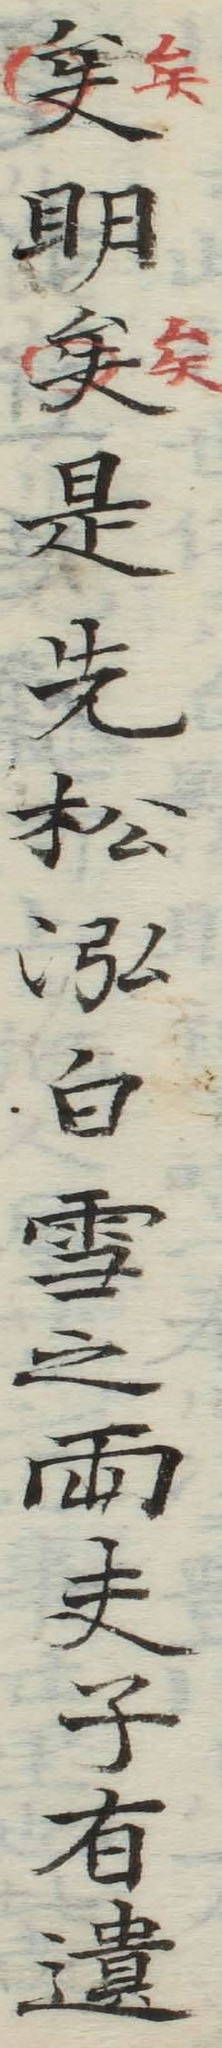矣眀矣是先松泓白雪之両夫子有遺
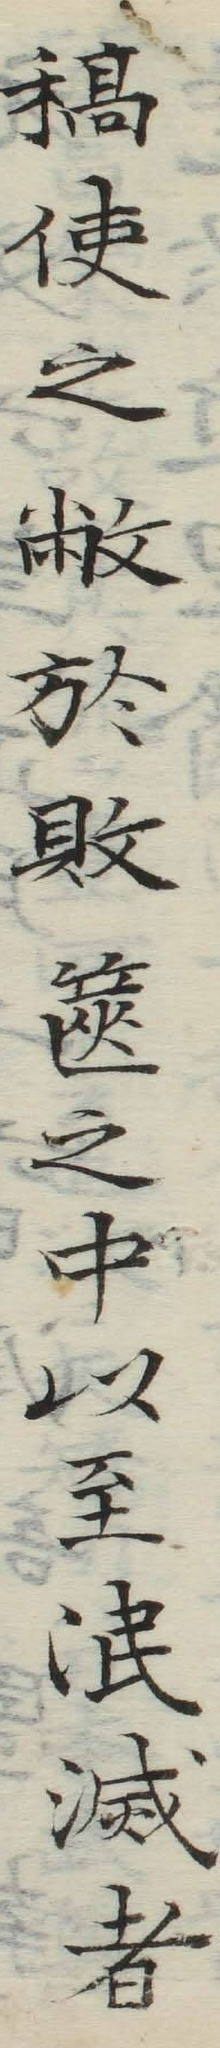稿使之敝於敗篋之中以至冺滅者
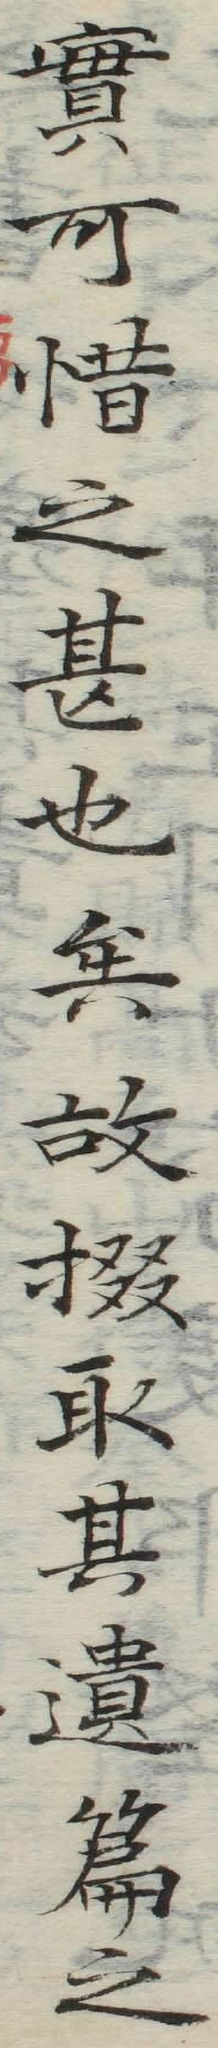實可惜之甚也矣故掇取其遺篇之
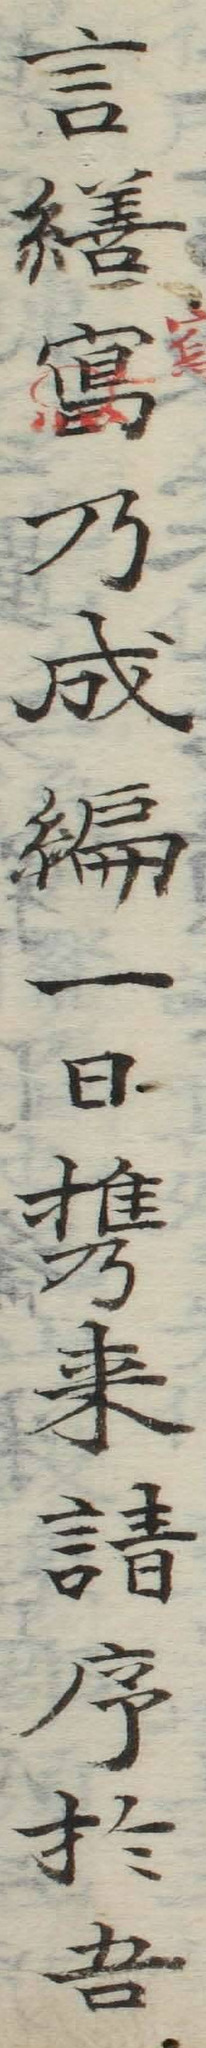言繕寫乃成編一日携来請序於吾
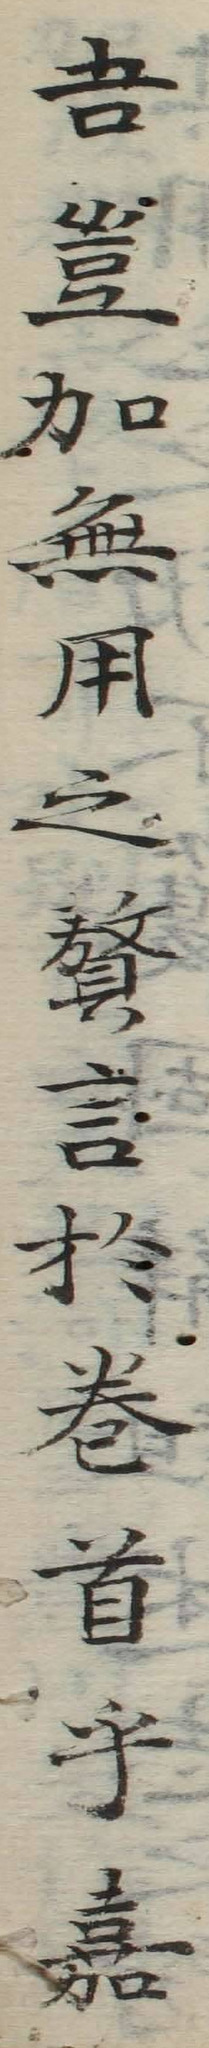吾豈加無用之贅言於巻首乎嘉

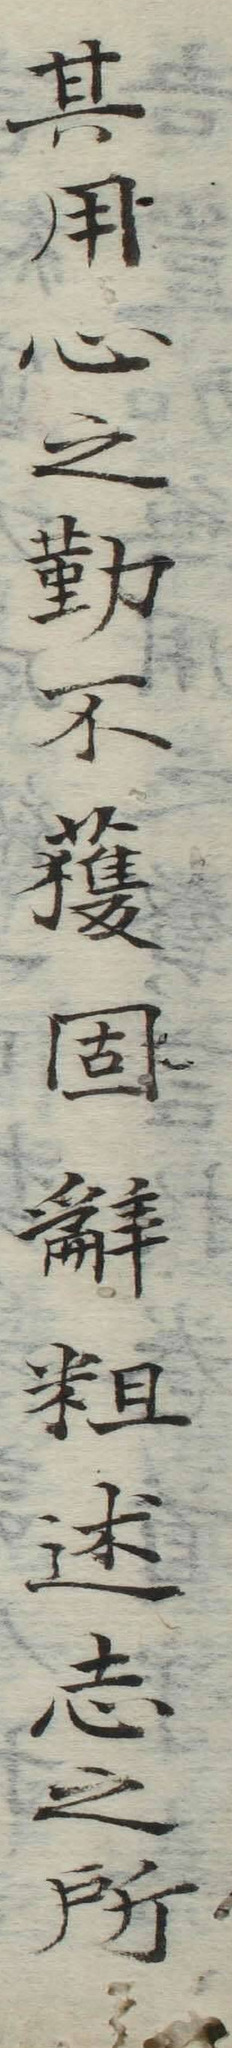其用心之勤不獲固辭粗述志之所
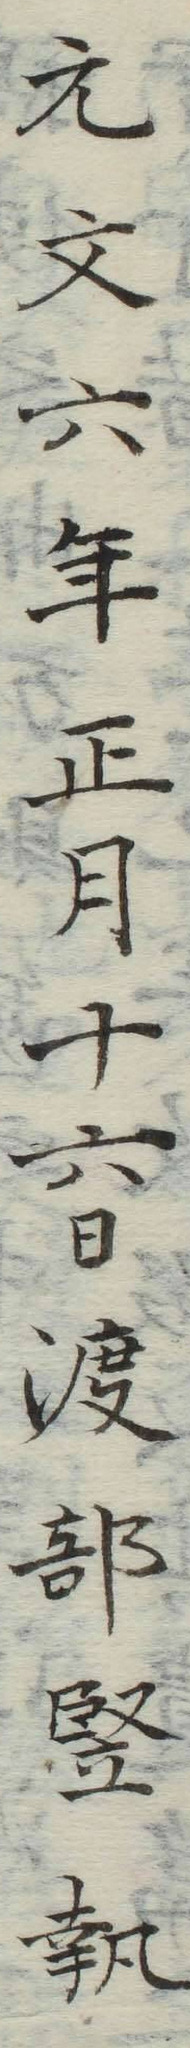元文六年正月十六日渡部竪執
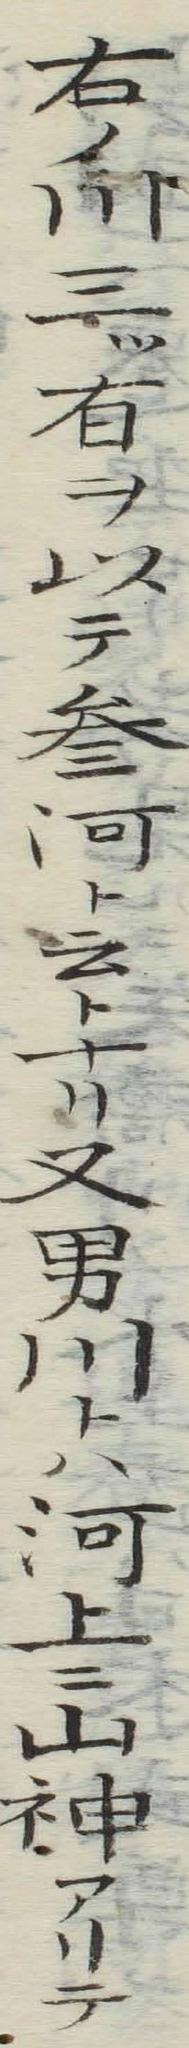右ノ川三ツ有ヲ以テ参河ト云トナリ又男川トハ河上ニ山神アリテ
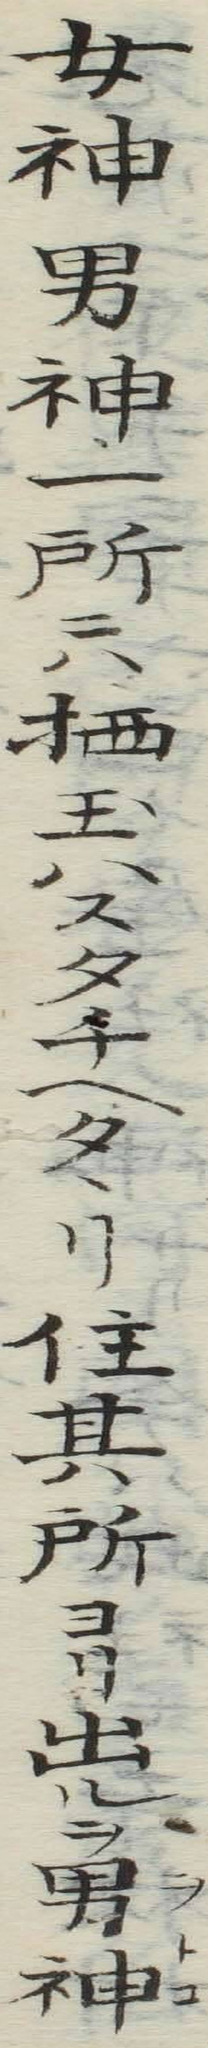女神男神一所ニハ栖玉ハスタチヘタヽリ住其所ヨリ出ルヲ男神
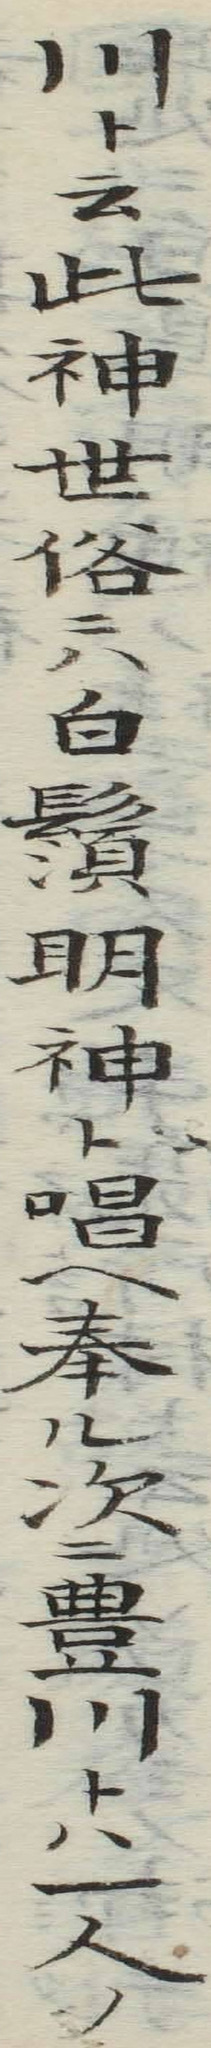川ト云此神世俗ニハ白鬚明神ト唱ヘ奉ル次ニ豊川トハ一人ノ
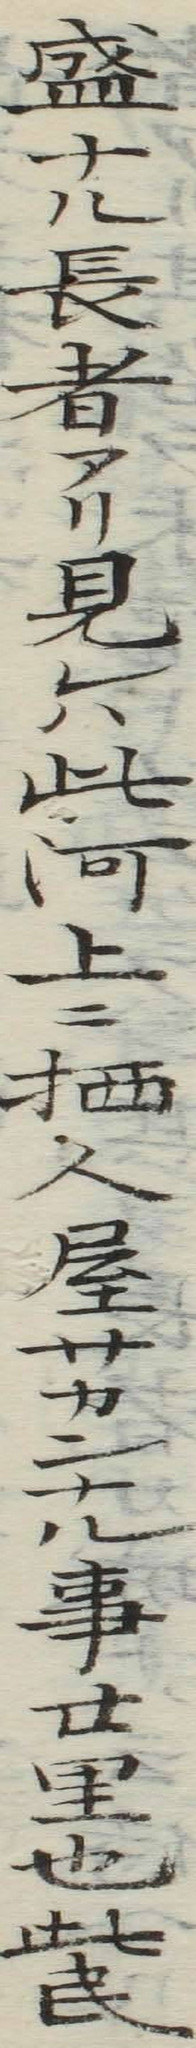盛ナル長者アリ見レハ此河上ニ拪人屋サカンナル事廿里也此民
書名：三河国二葉松
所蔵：国文学研究資料館
